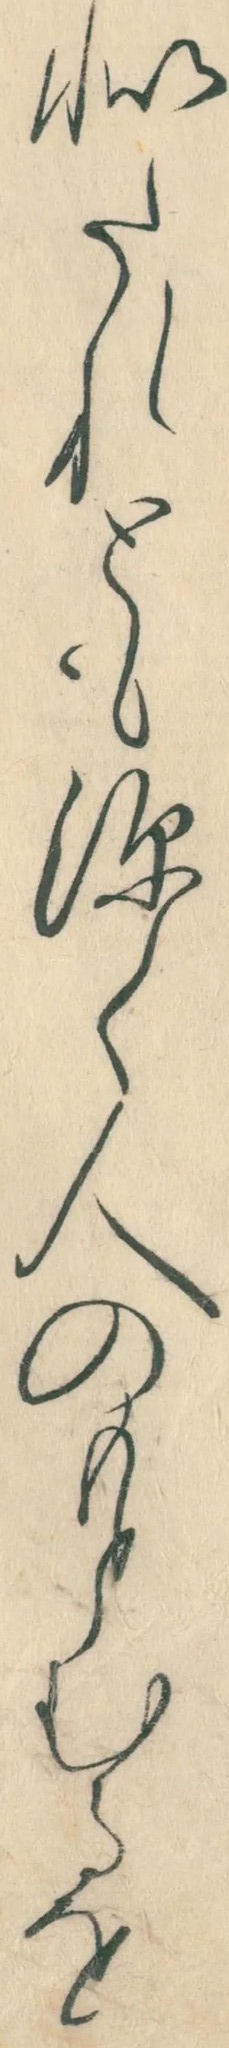似たれとも深く人のもとむるを
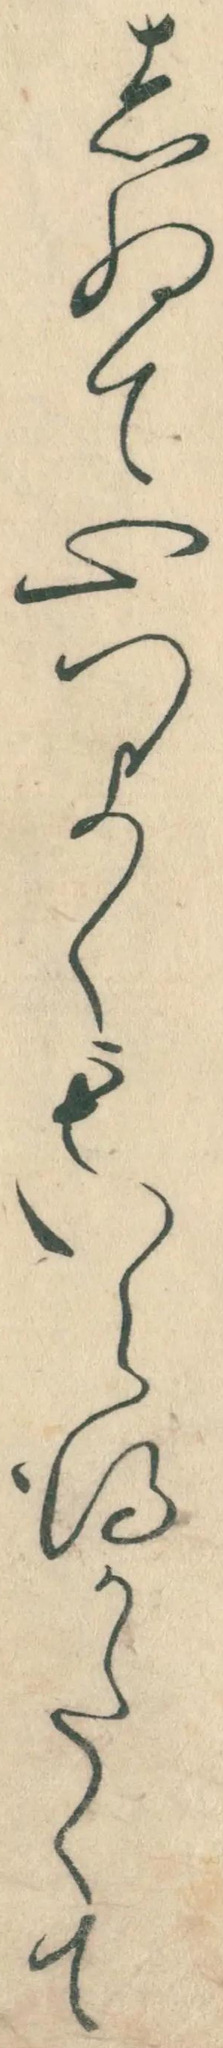しゐて心つよくもいらえかたくて
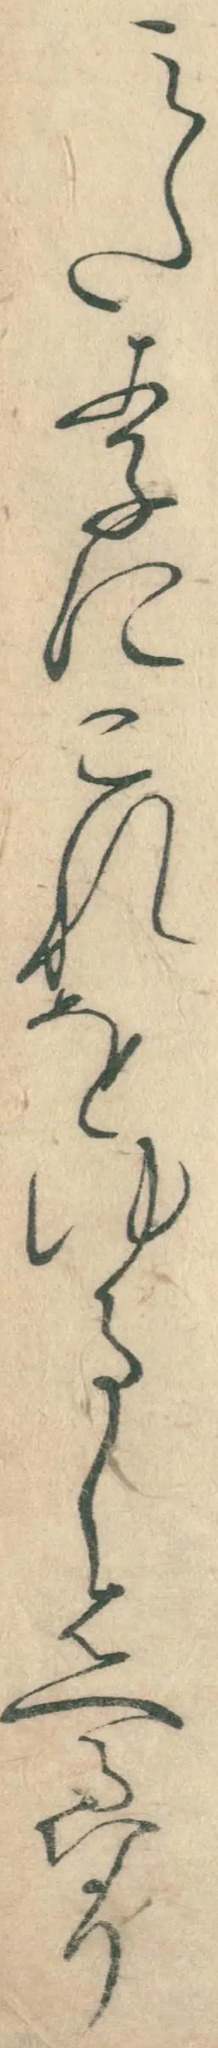みたりにこれをゆるしはへるなり

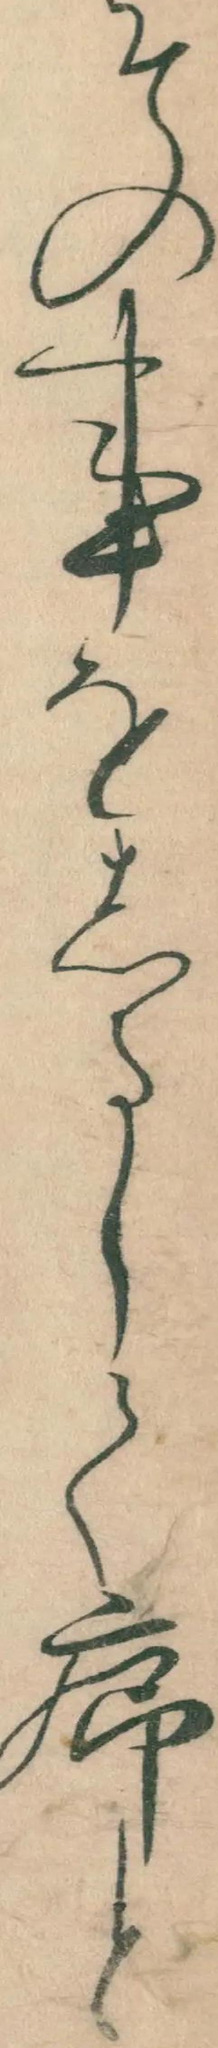その事をしるして序と
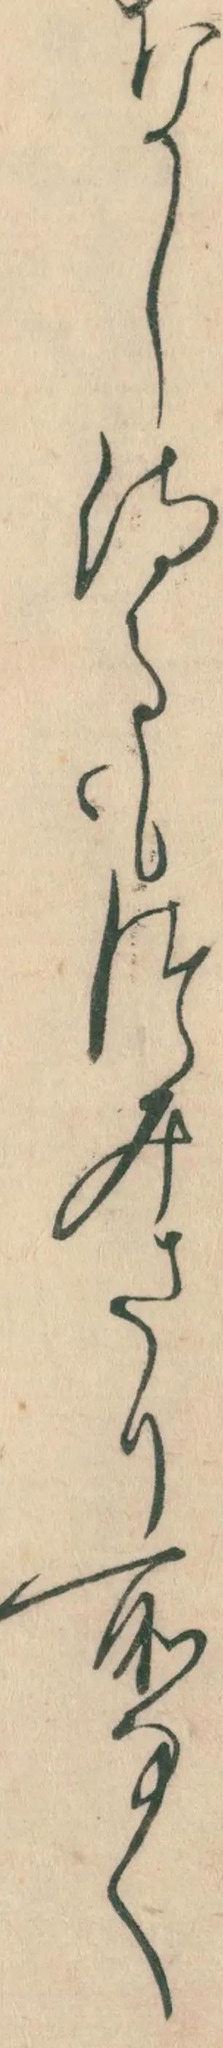なし侍るもつみさり所なく
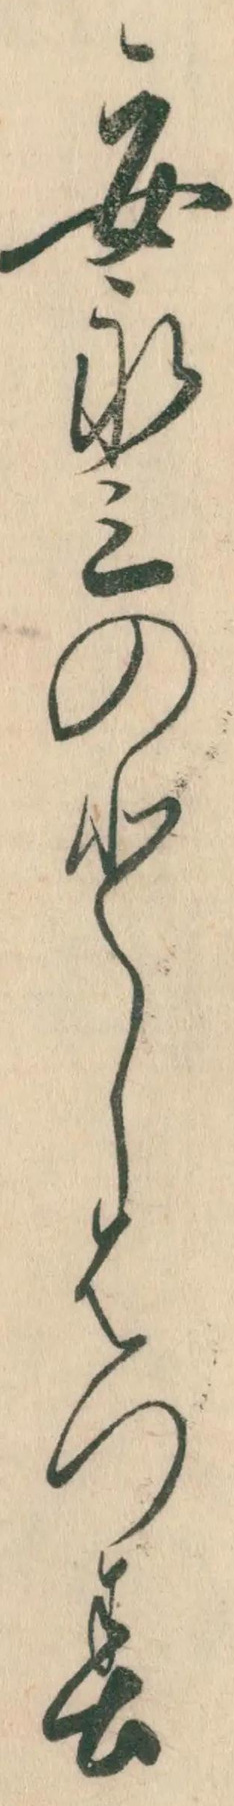安永三のとしはつ春
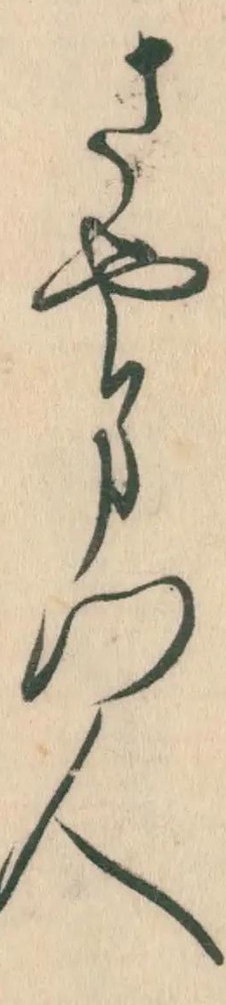さやま門人
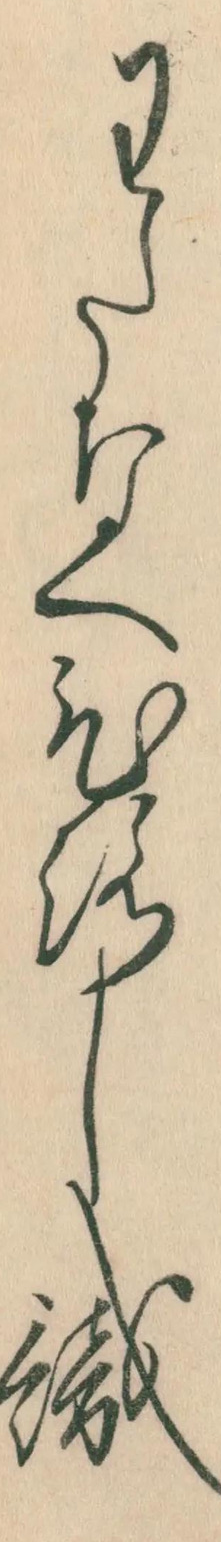わたなへひろし識
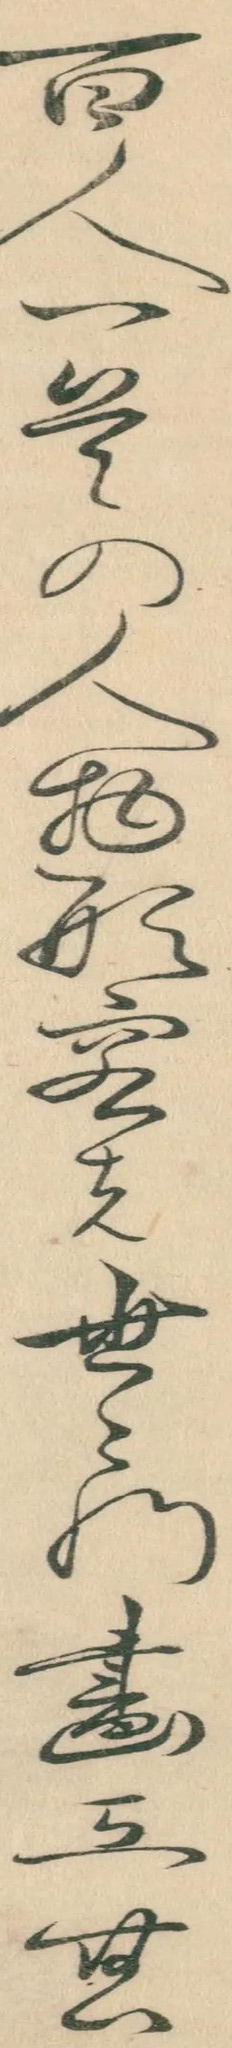百人一首の人物形容は世々の画工其
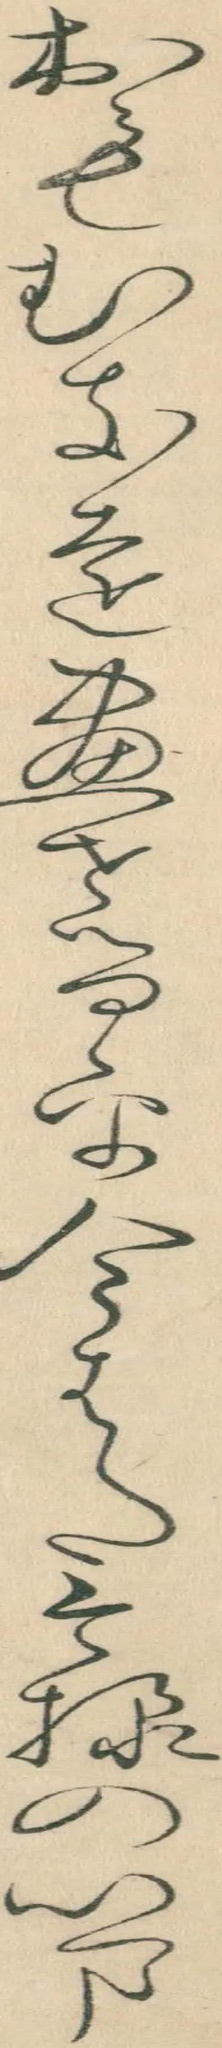おもむきを画せるを今はた今様のいま
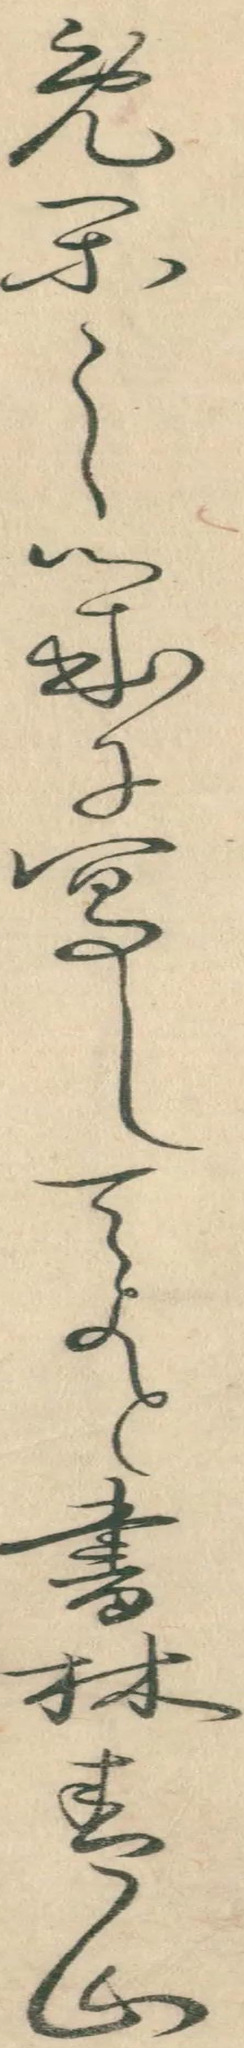めかし心成に写してよと書林青山
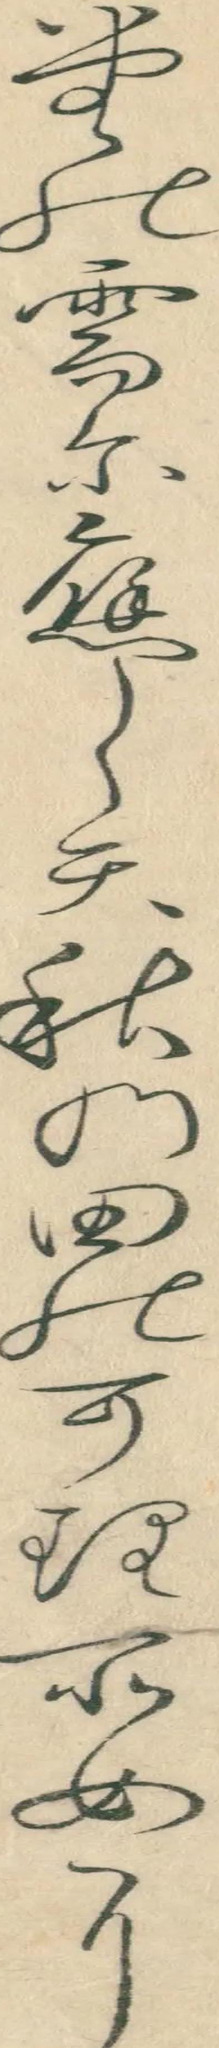堂の需に応して秋の田のかりそめに
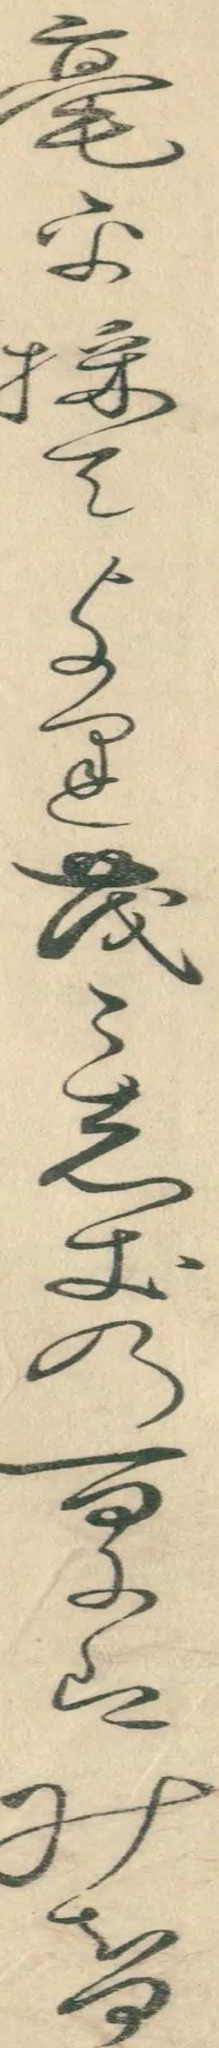毫を採りてよりもゝしきの百にはみちる
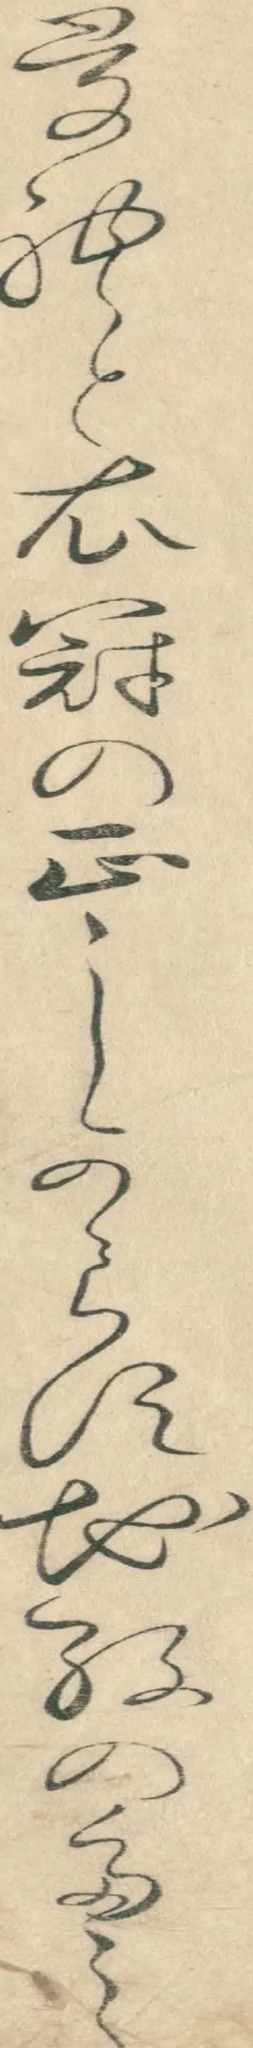哥の神と衣冠の正しからす地紋のたし
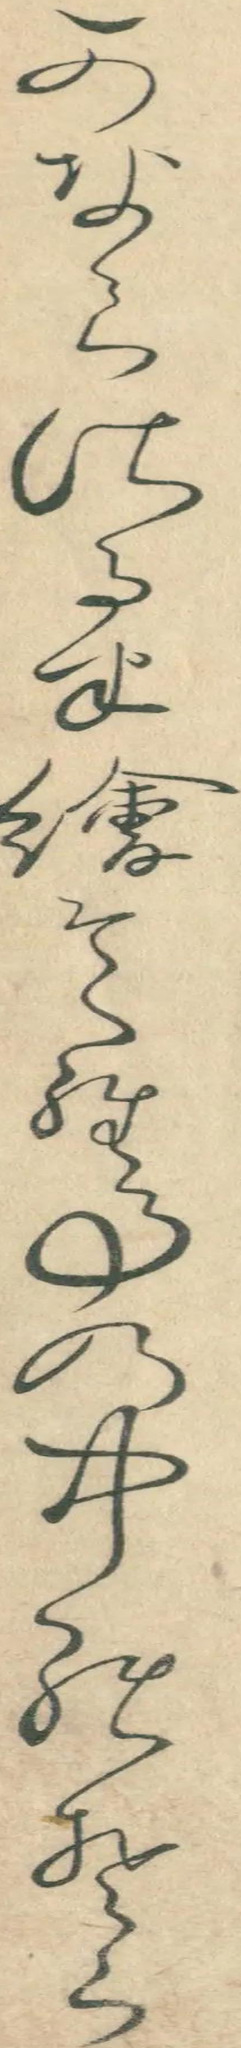かならさるは絵そら事の中のそら

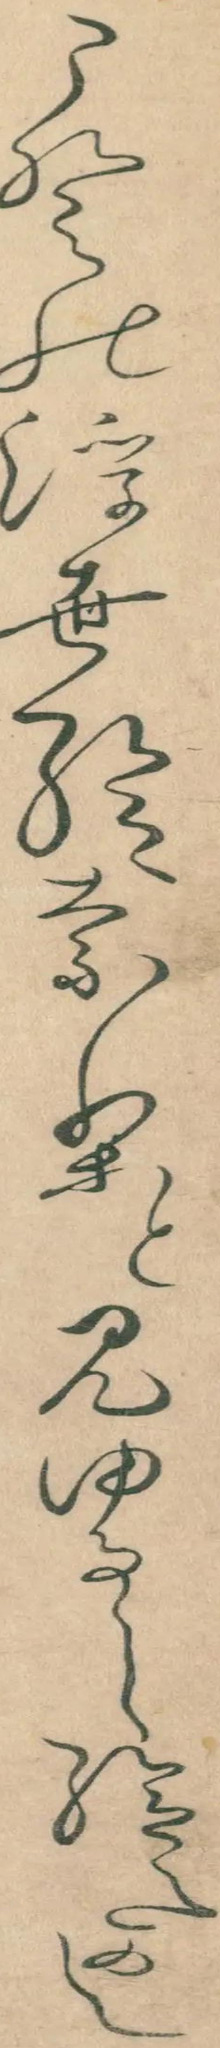ことの浮世絵なりと見ゆるし給へかし
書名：錦百人一首あつま織
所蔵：国立国会図書館 National Diet Library, JAPAN
